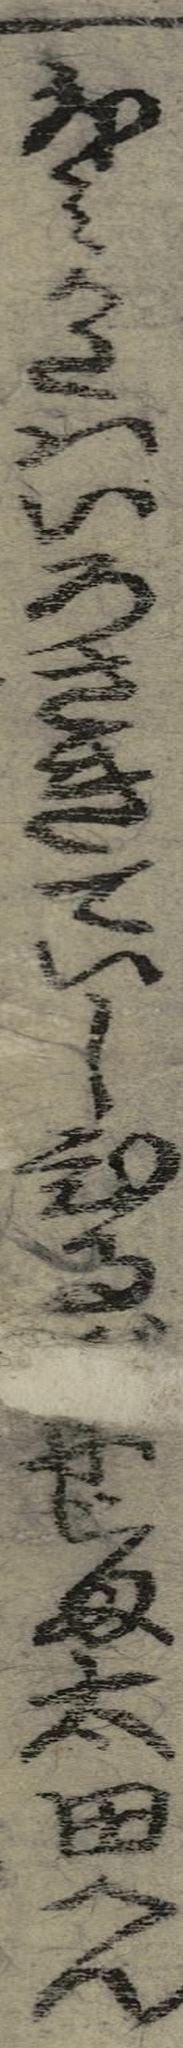外のかたハいろさきていし至るせじま太田へん
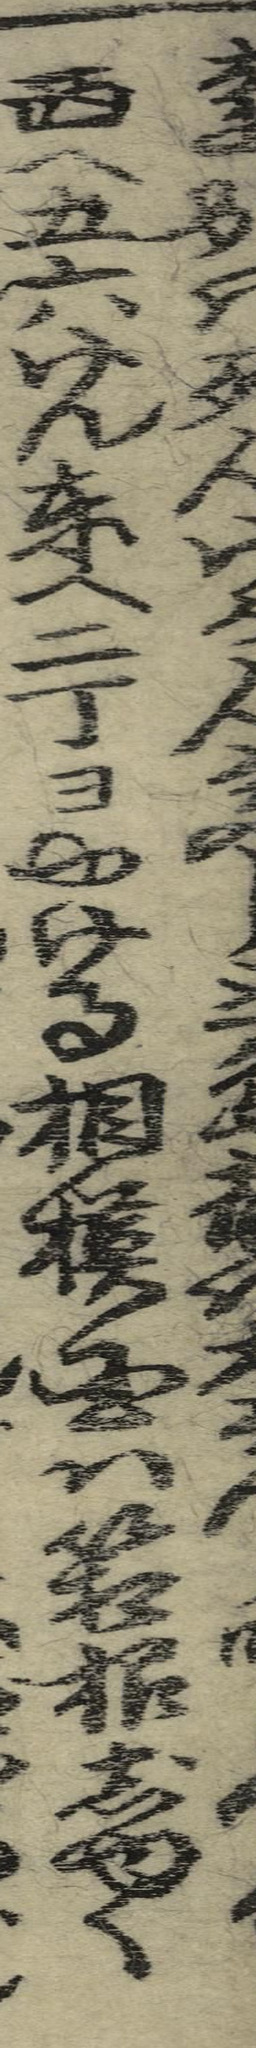西へ五六けん東へ二丁ヨやける相模国ハ箱根しゆく
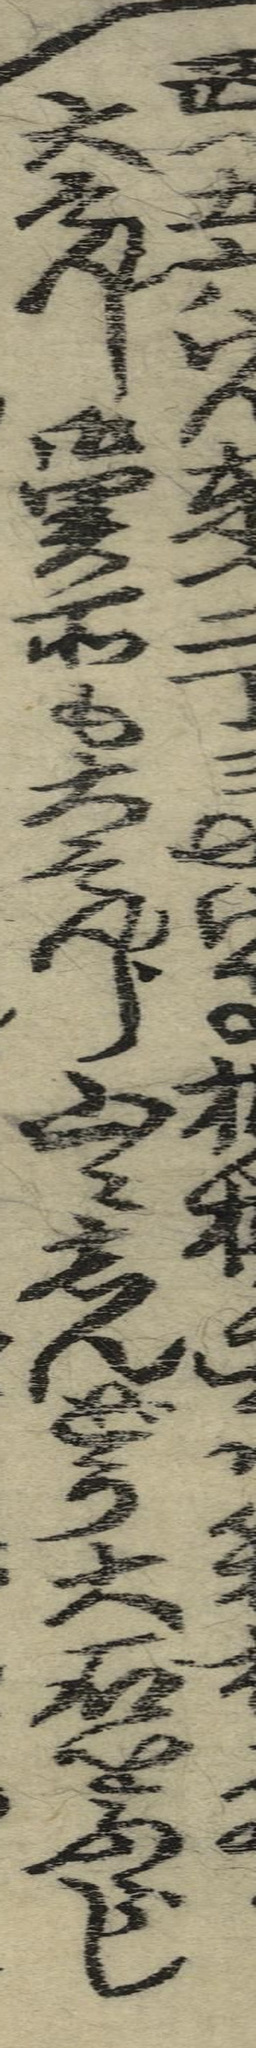大そんし御関所も大そんじ山々しんどう大石をふらし
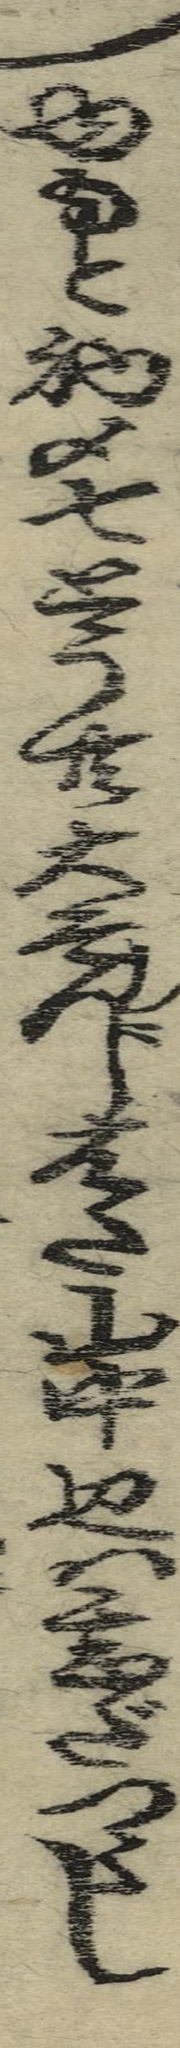ゆもと初〆七とう共大そんじわた山中辺ハ甚だつらし
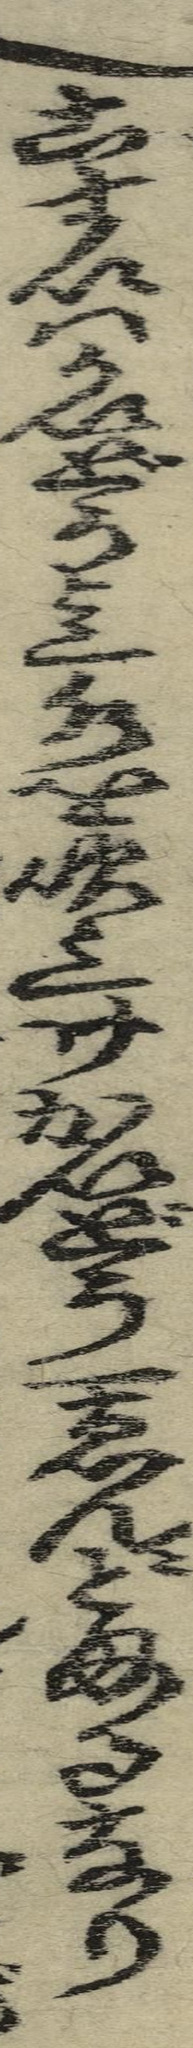こすいハかいどう迄水を吹上けかいどう一えんニとまるなり
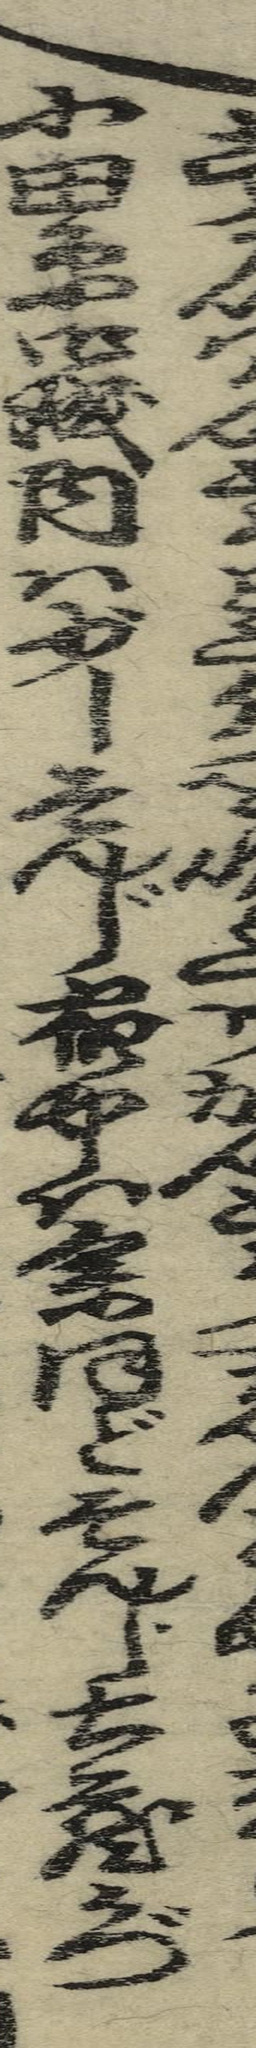小田原御城内ハ少しそんじ宿中ハ余ほどそんじ土蔵かづ
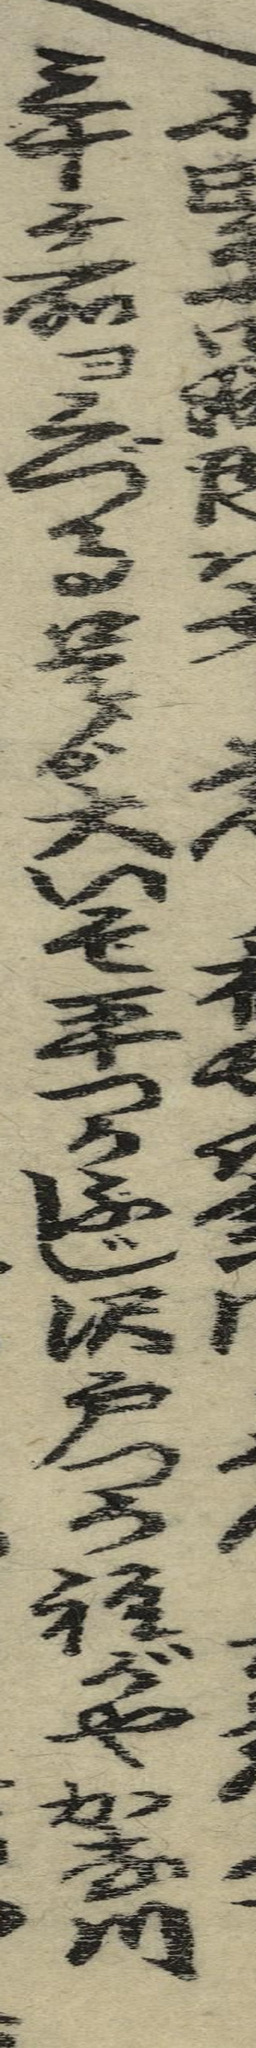三十ケ所ヨくづる是ゟ大いそ平つかふじ沢戸つか程がやかな川
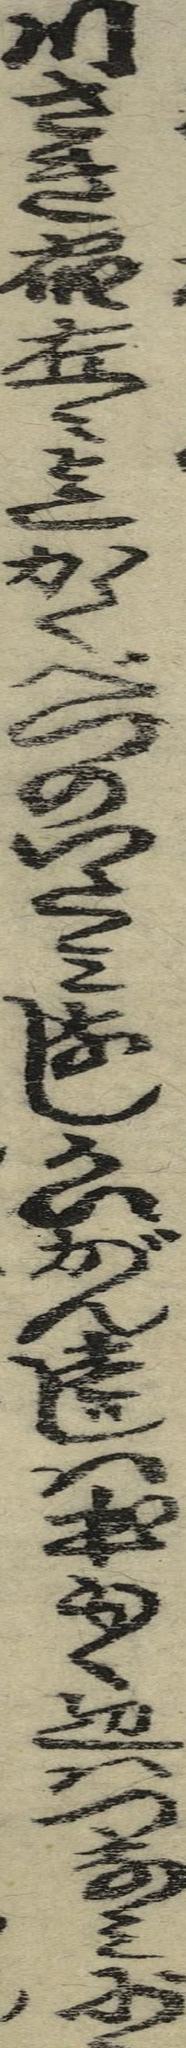川さき宿在々迄かくべつのいたミなしかいがんすじハ本もく辺ハつなミ少々
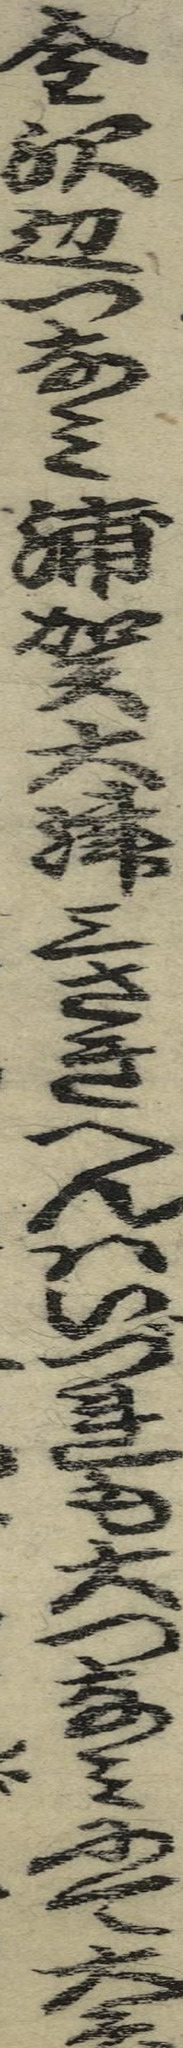金沢辺つなミ浦賀大津三さきへんハいづれも大つなミにて大急ぎ
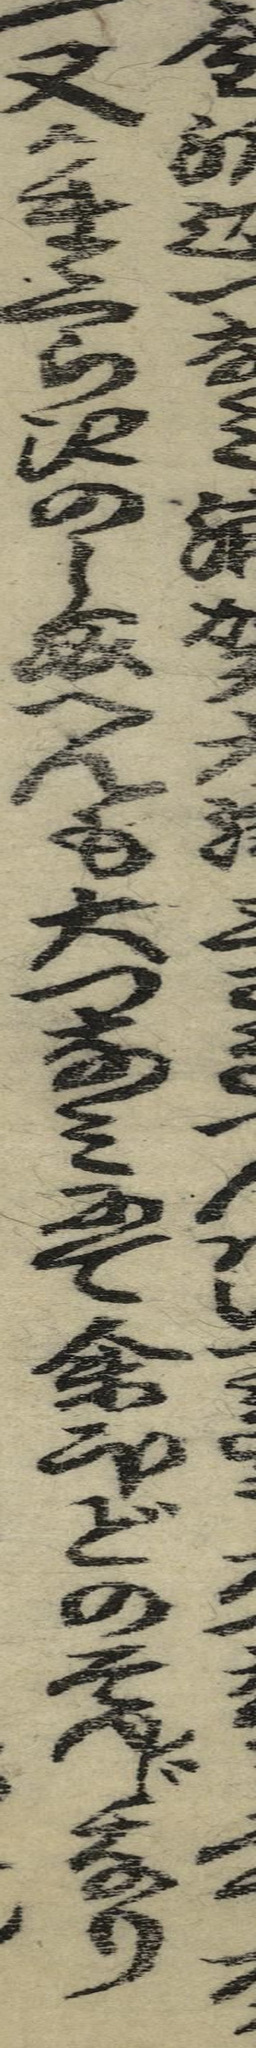又かまくら池のしまへんも大つなミにて余ほどのそんじなり
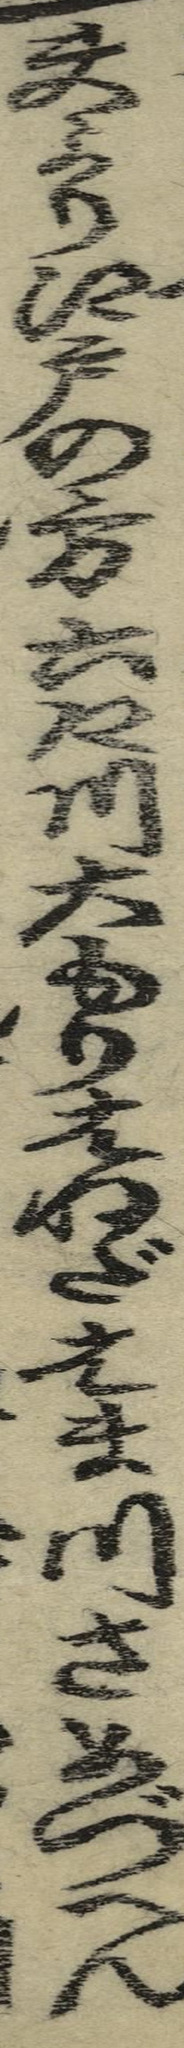夫より江戸の方六郷川大もりはねだはま川さめづへん
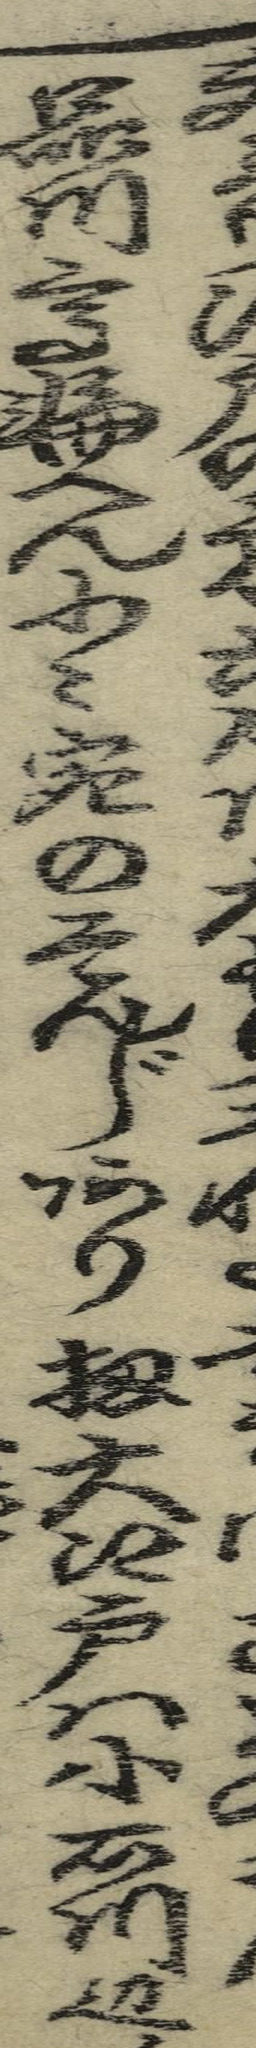品川高輪へん少々宛のそんじあり扨大江戸ハ小石川辺ゟ
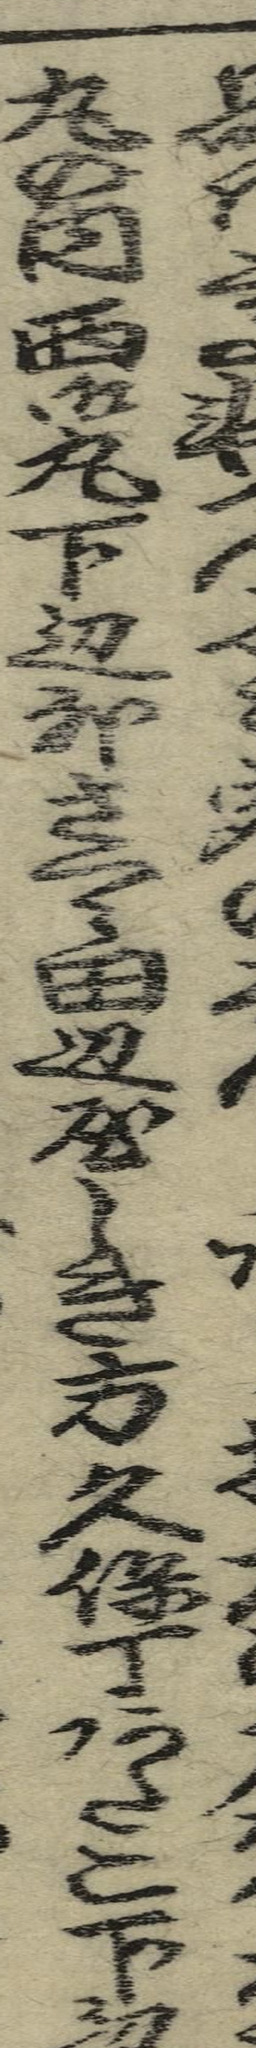丸の内西御丸下辺外さくら田屋しき方久保丁あたこした辺
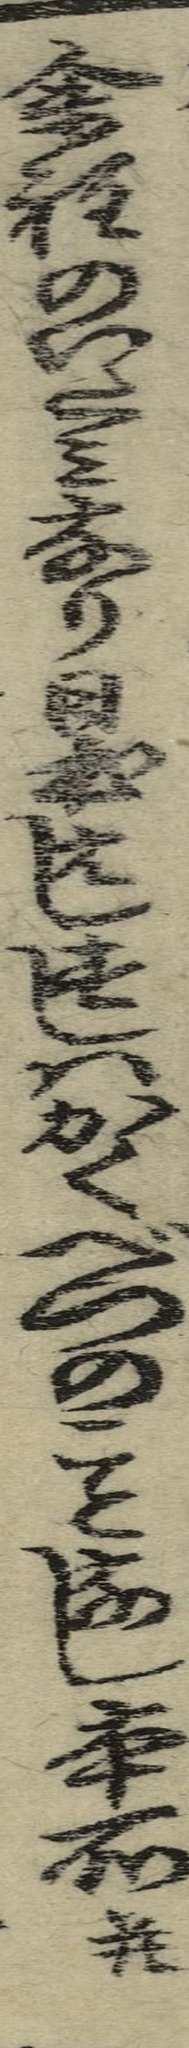余程のいたミなり日本はしすしハかくべつのことなし本所幷
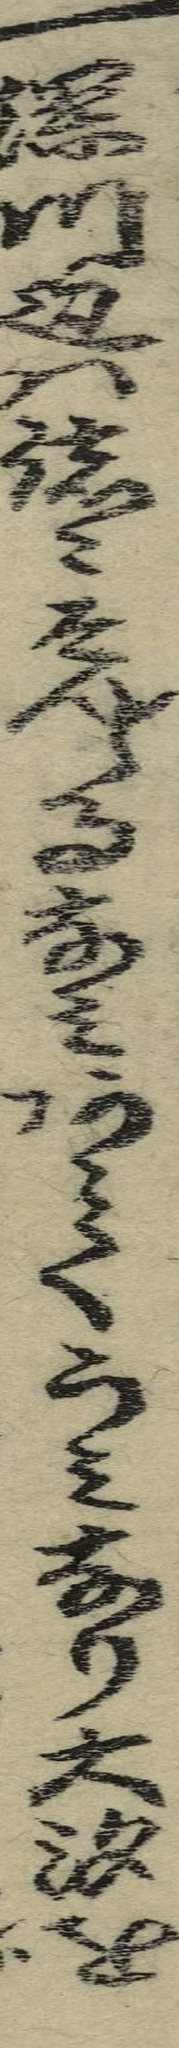深川辺ハ諸々そんじるなミあらくうミなり大汐を
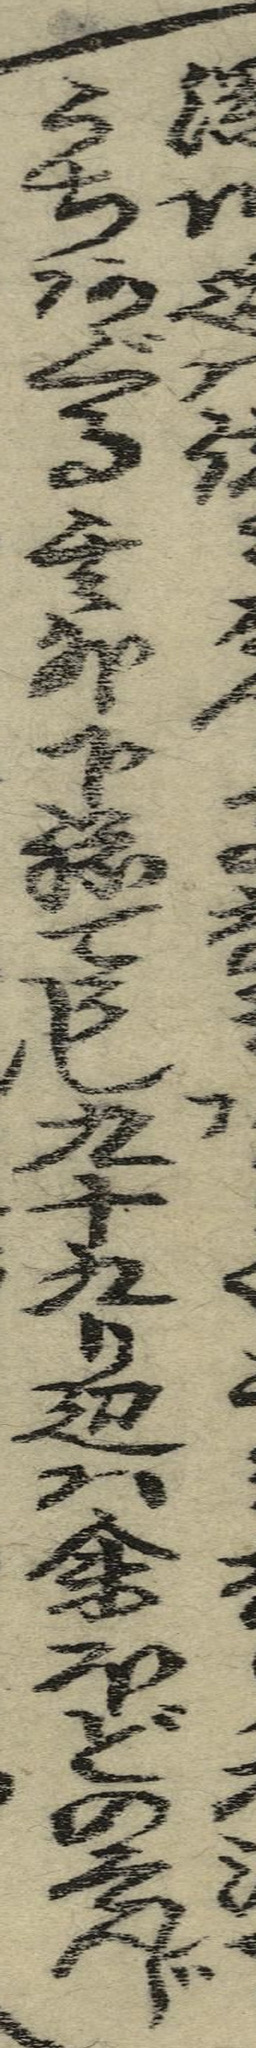うちあぐる其外下総てろし九十り辺ハ余ほどのそんじ
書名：諸國大地震并大津浪
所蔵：東京大学地震研究所図書室 Earthquake Research Institute Library, The University of Tokyo, JAPAN
